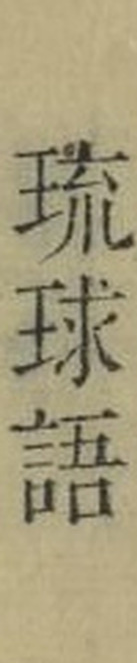琉球語
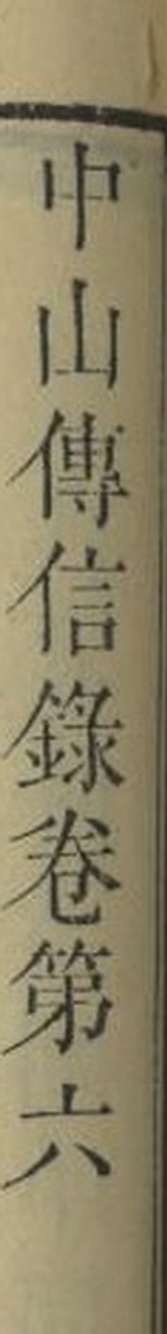中山伝信録巻第六
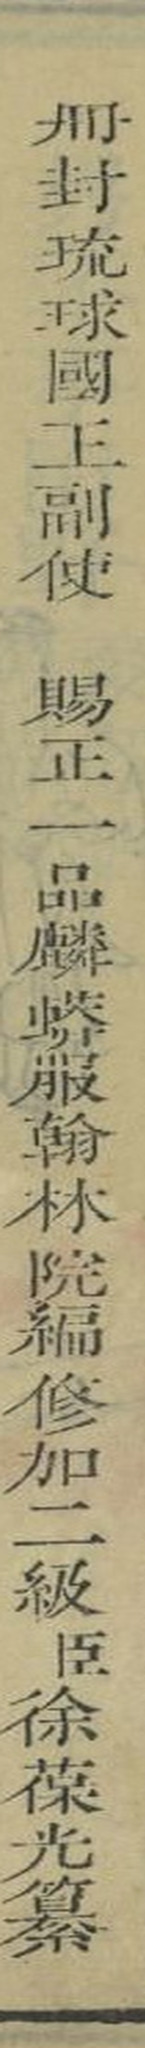冊封琉球国王副使賜正一品麟蟒服翰林院編修加二級臣徐葆光纂
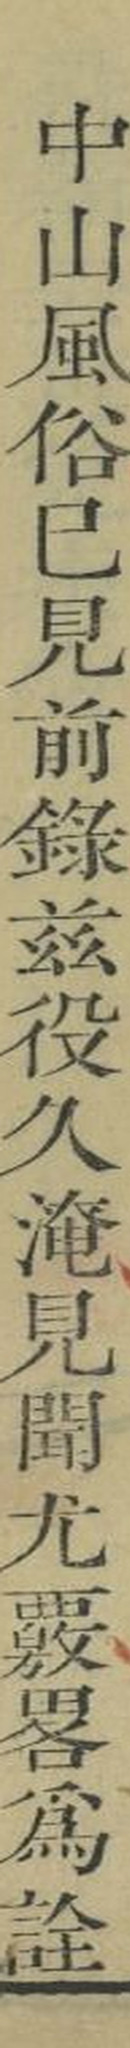中山風俗巳見前録茲役久淹見聞尤覈略為詮
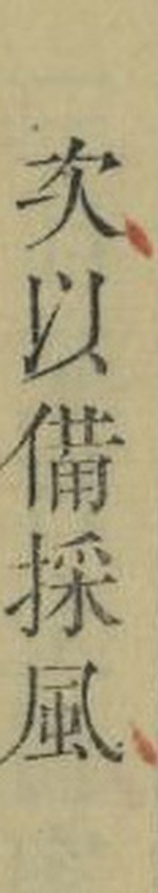次以備採風
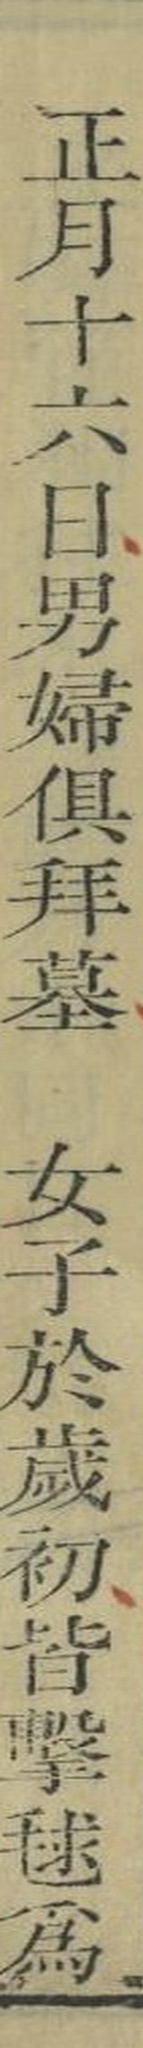正月十六日男婦倶拝墓女子於歳初皆撃毬為
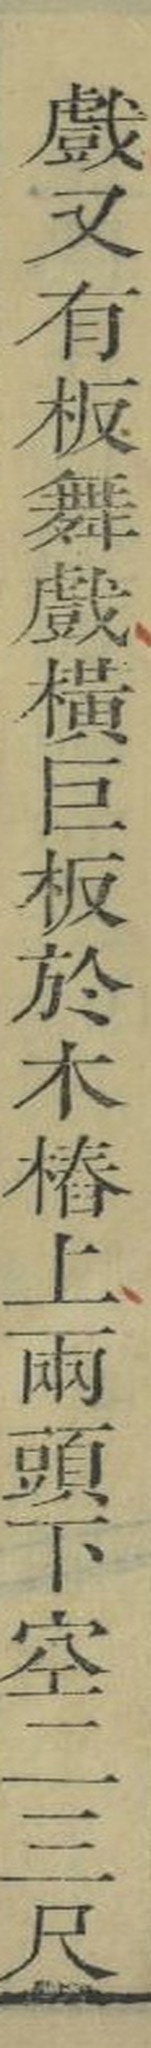戯又有板舞戯横巨板於木椿上両頭下空二三尺
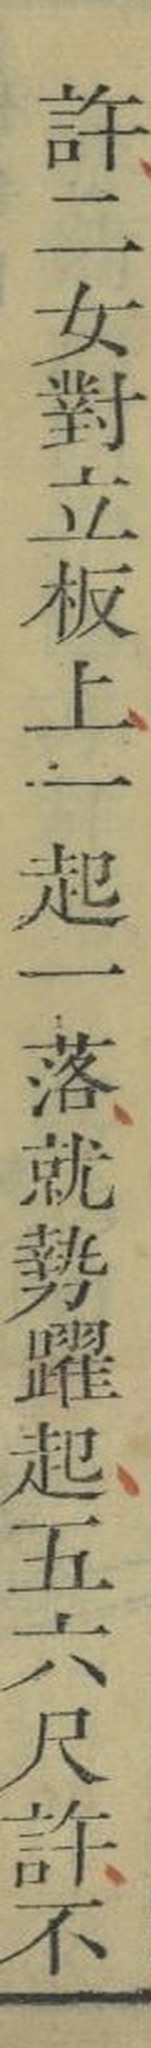許二女対立板上一起一落就勢躍起五六尺許不

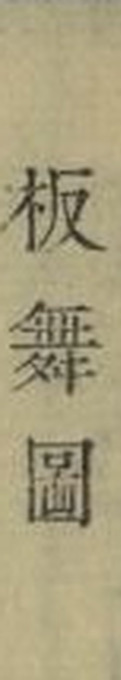板舞図
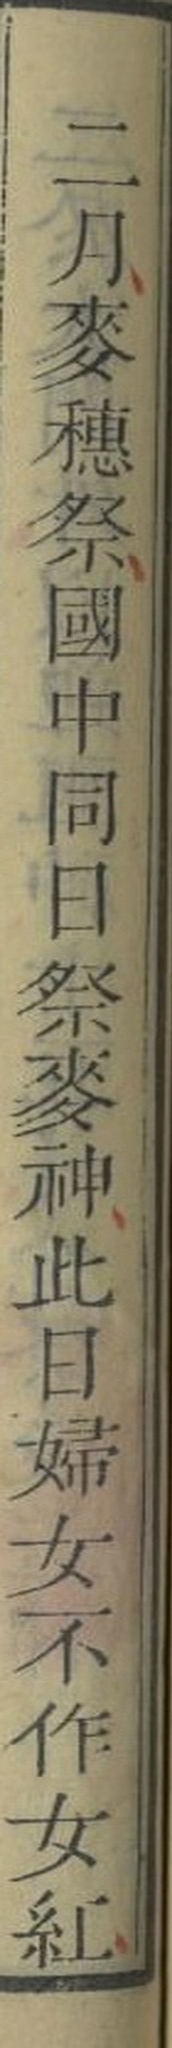二月麦穂祭国中同日祭麦神此日婦女不作女紅
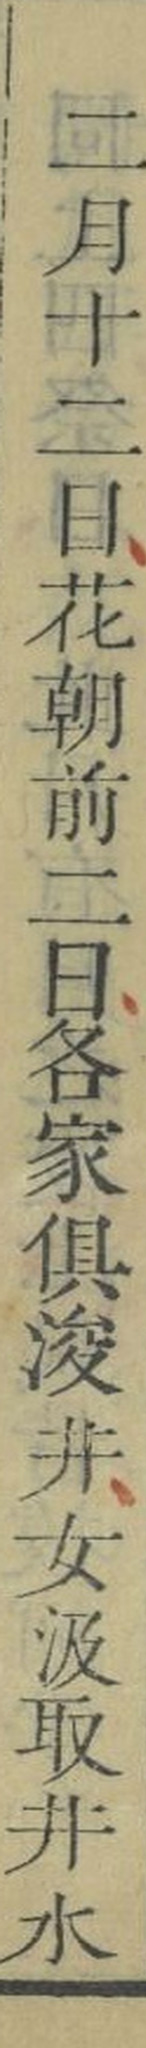二月十二日花朝前二日各家俱浚井女汲取井水
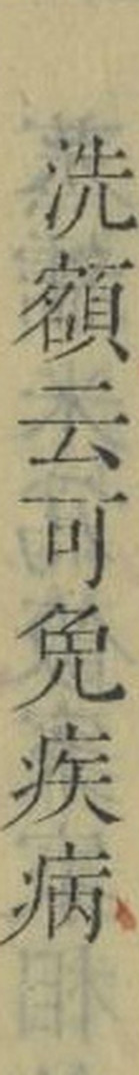洗額云可免疾病
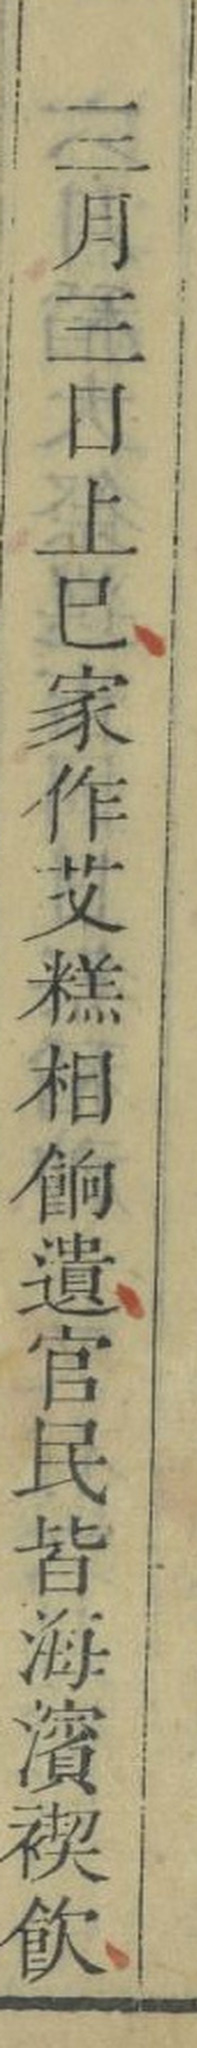三月三日上巳家作艾糕相餉遺官民皆海浜禊飲
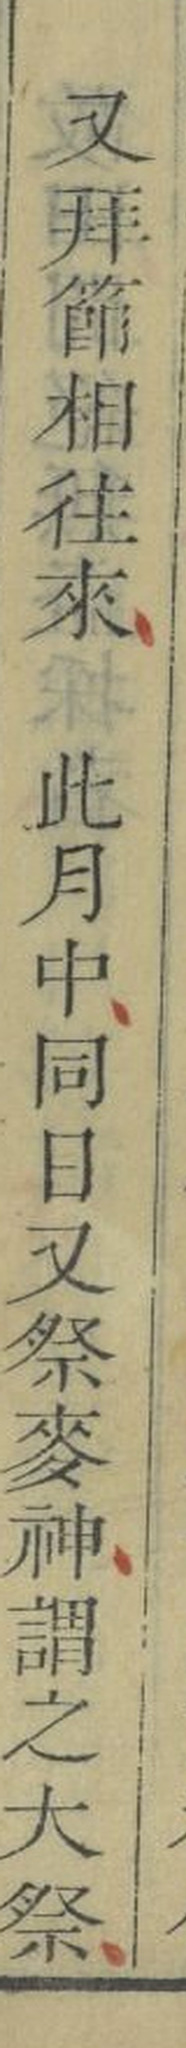又拝節相往来此月中同日又祭麦神謂之大祭
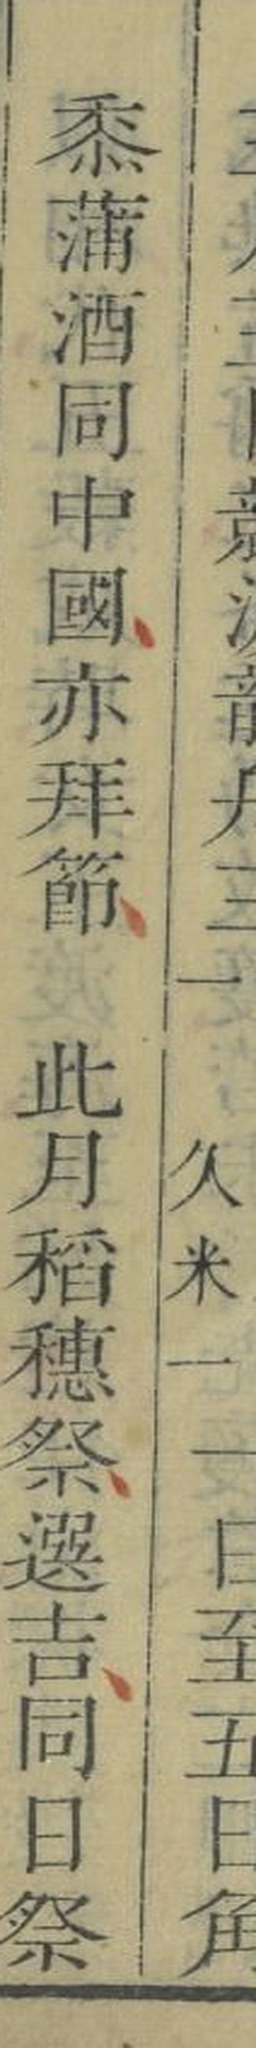黍蒲酒同中国亦拝節此月稲穂祭選吉同日祭
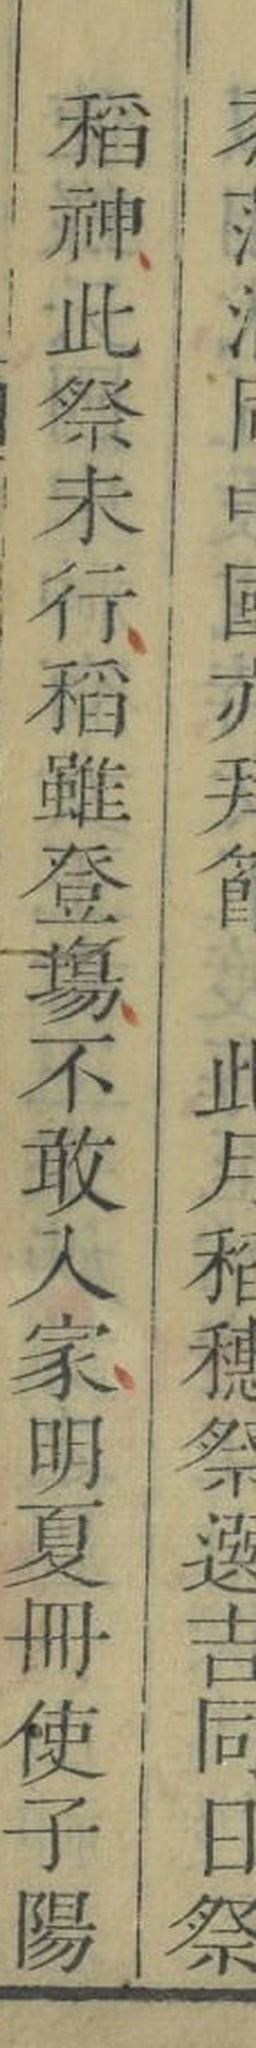稲神此祭未行稲雖登場不敢入家明夏冊使子陽
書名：中山伝信録 巻六
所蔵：University of the Ryukyus Library
